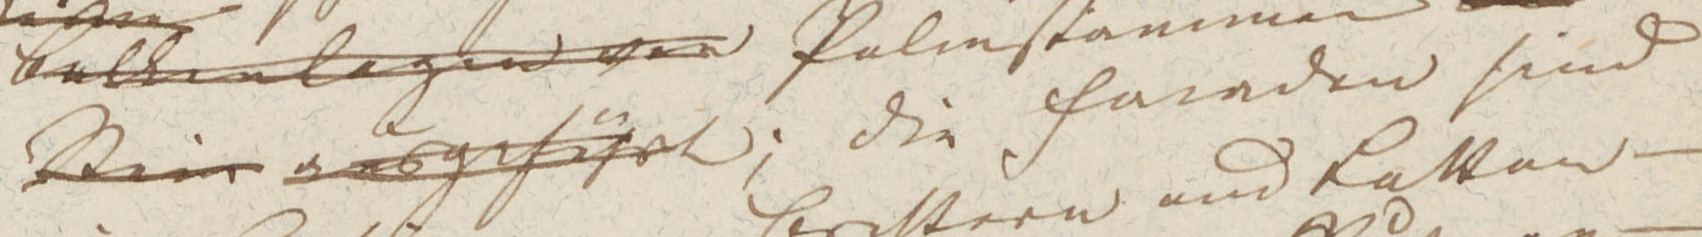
Stein ausgeführt; die Facaden sind
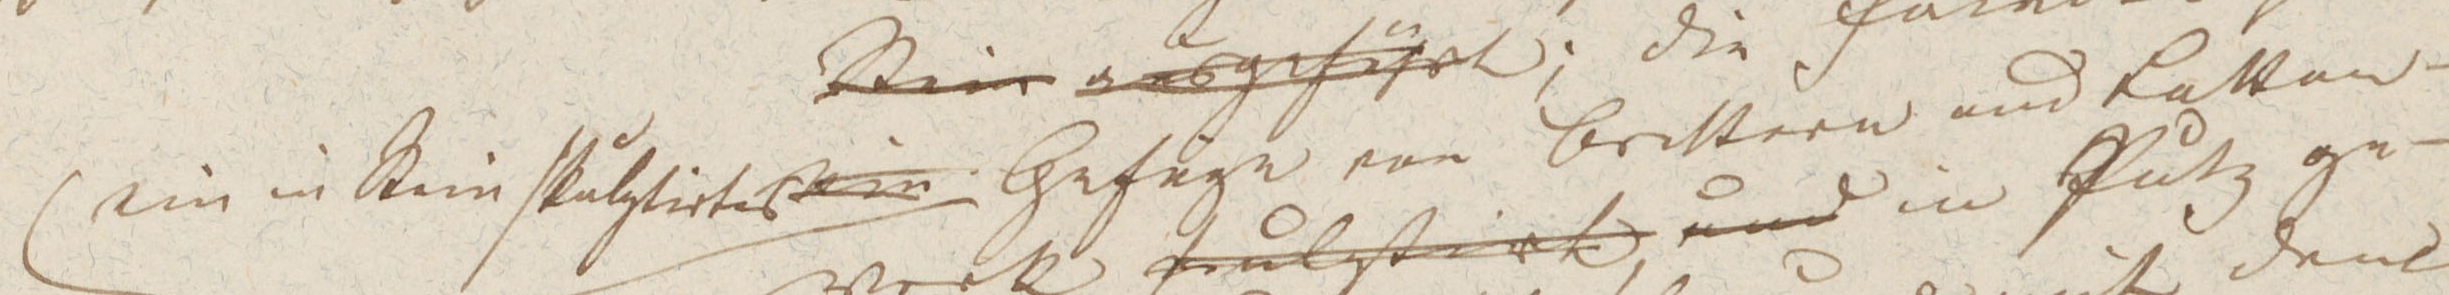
ein in Stein skulptirtes ein Gefüge von Brettern und Latten-
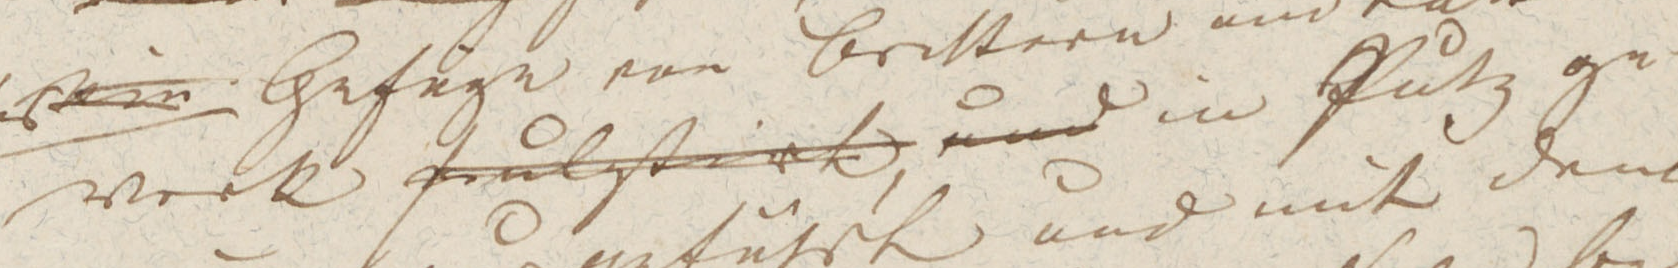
werk sculptirt, und in Putz ge-
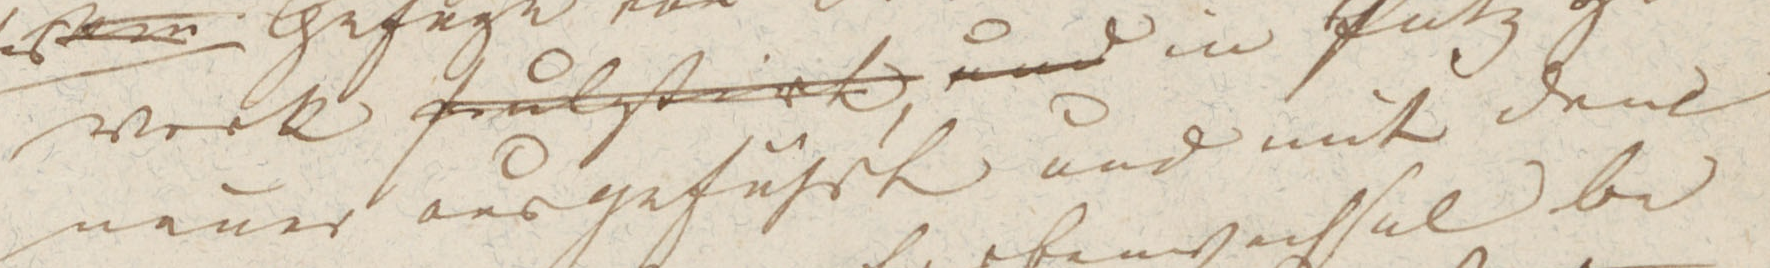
nauer ausgeführt und mit denm
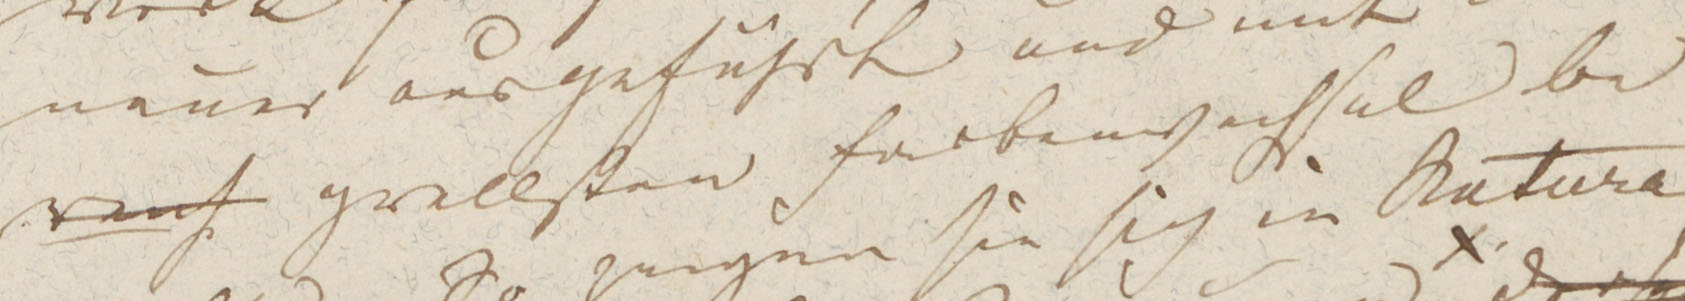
reich grellsten Farbenwechsel be
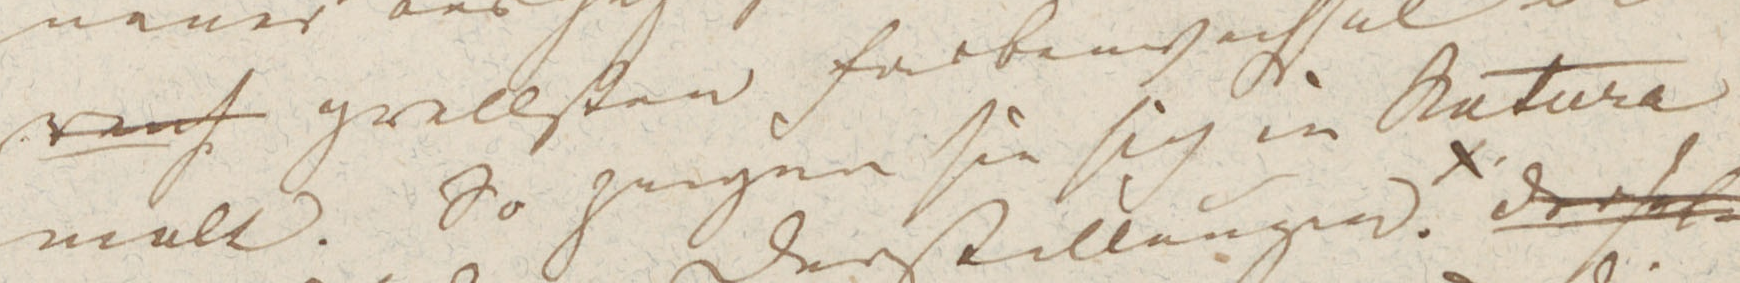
malt. So zeigen sie sich in Natura
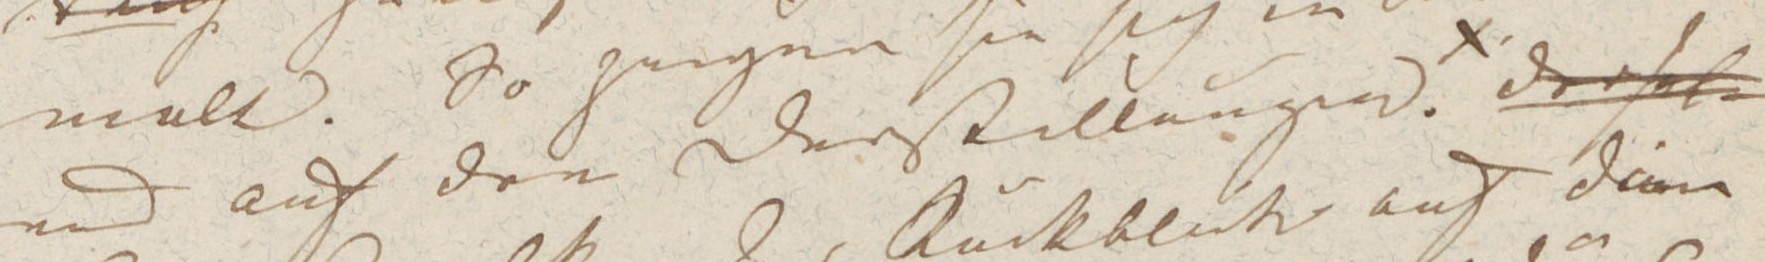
und auf den Darstellungen. % dersel-
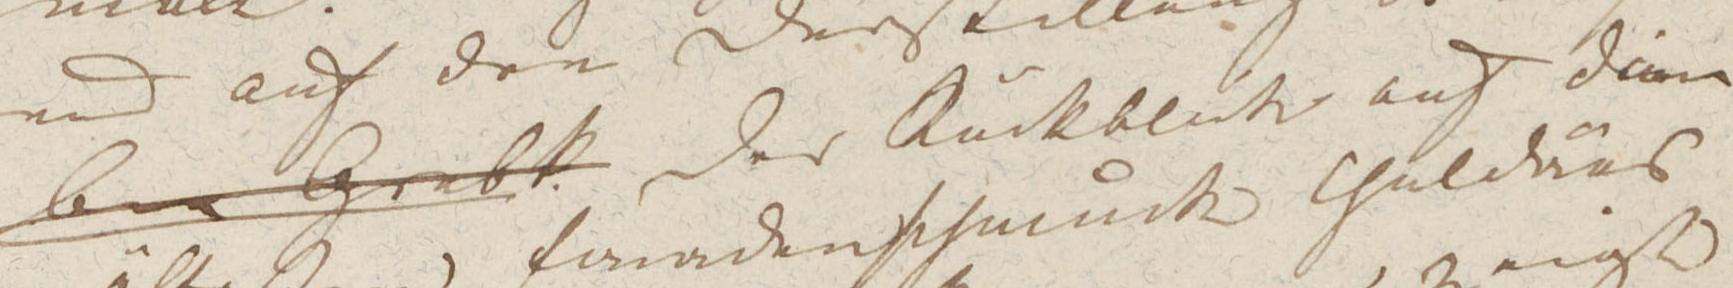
ben Grabk Der Rückblick auf dieen
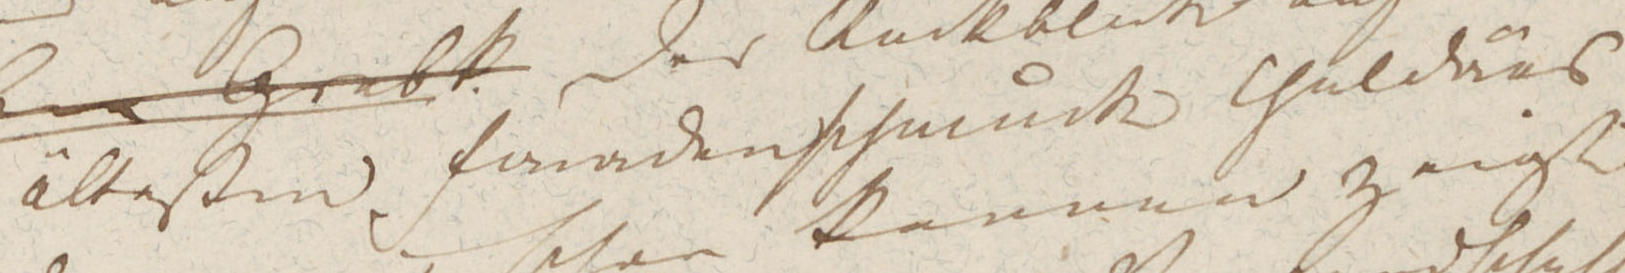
ältesten Facadenschmuck Chaldäas
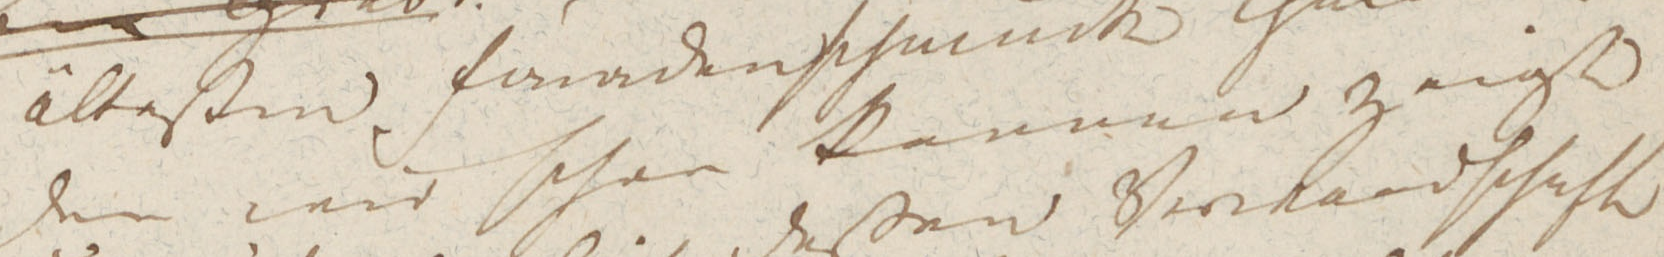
den wir schon kennen zeigt
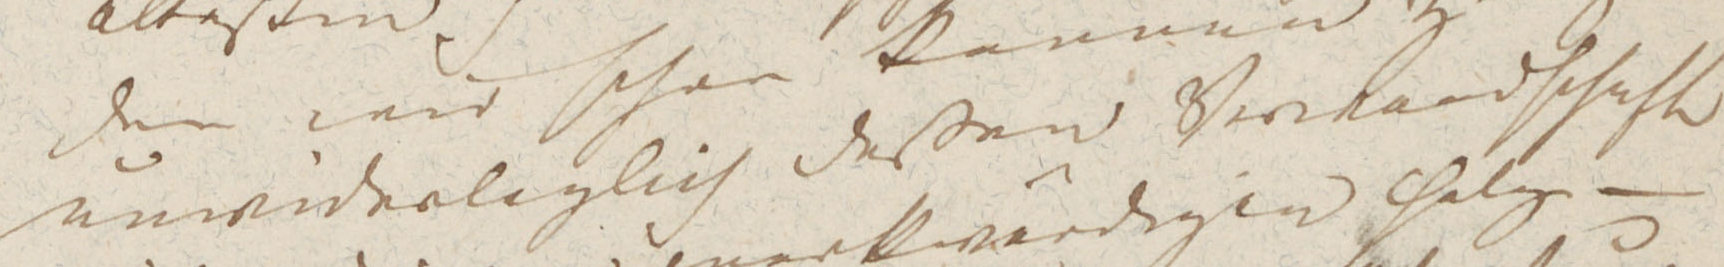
unwiderleglich dessen Verwandschaft
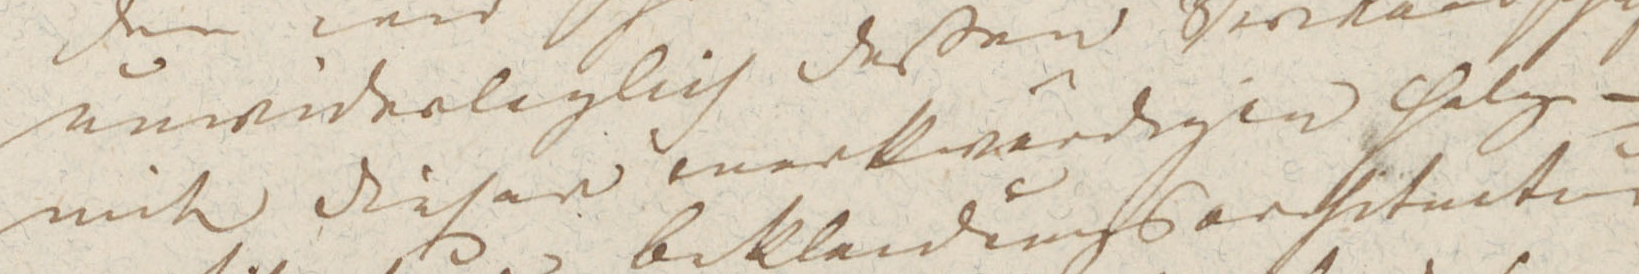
mit dieser merkwürdigen Holz-
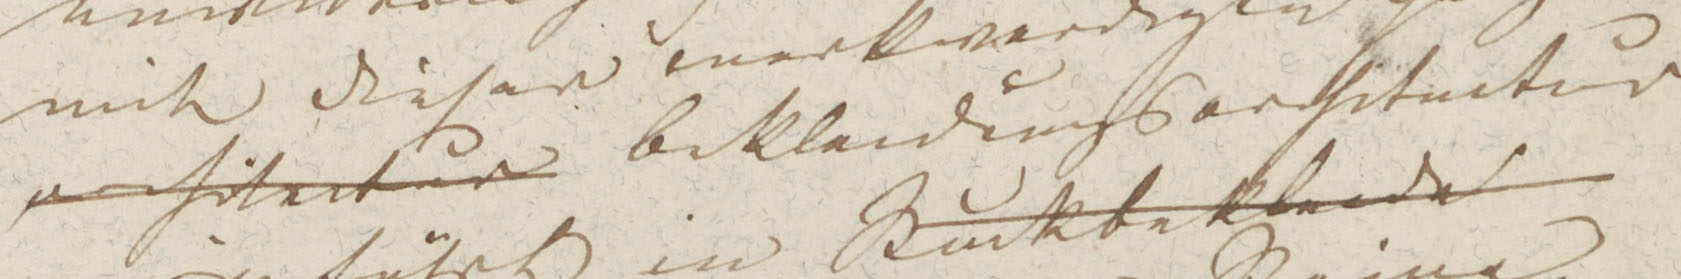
architectur bekleidungsarchitectur
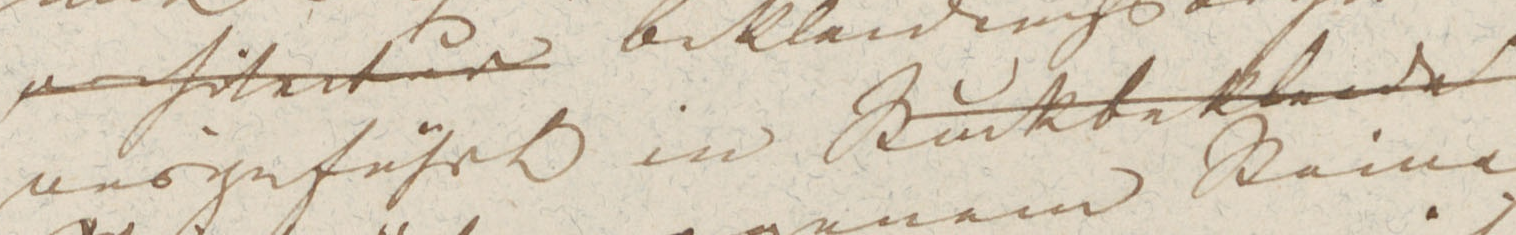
ausgeführt in Stuckbekleide
